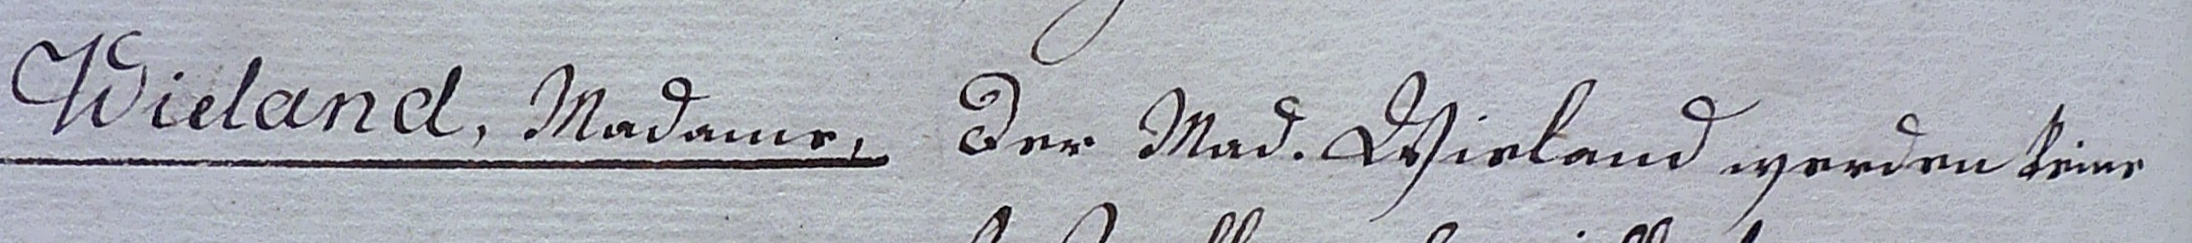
Wieland, Madame. Der Mad. Wieland werden keine
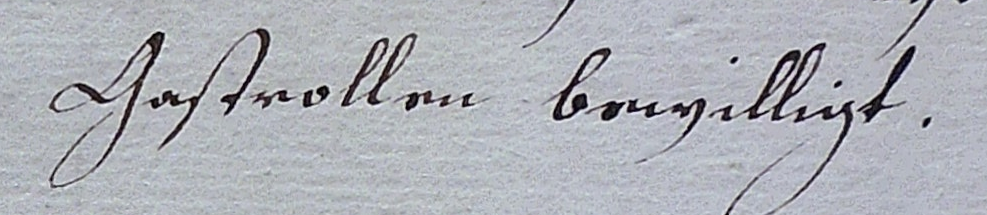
Gastrollen bewilligt.
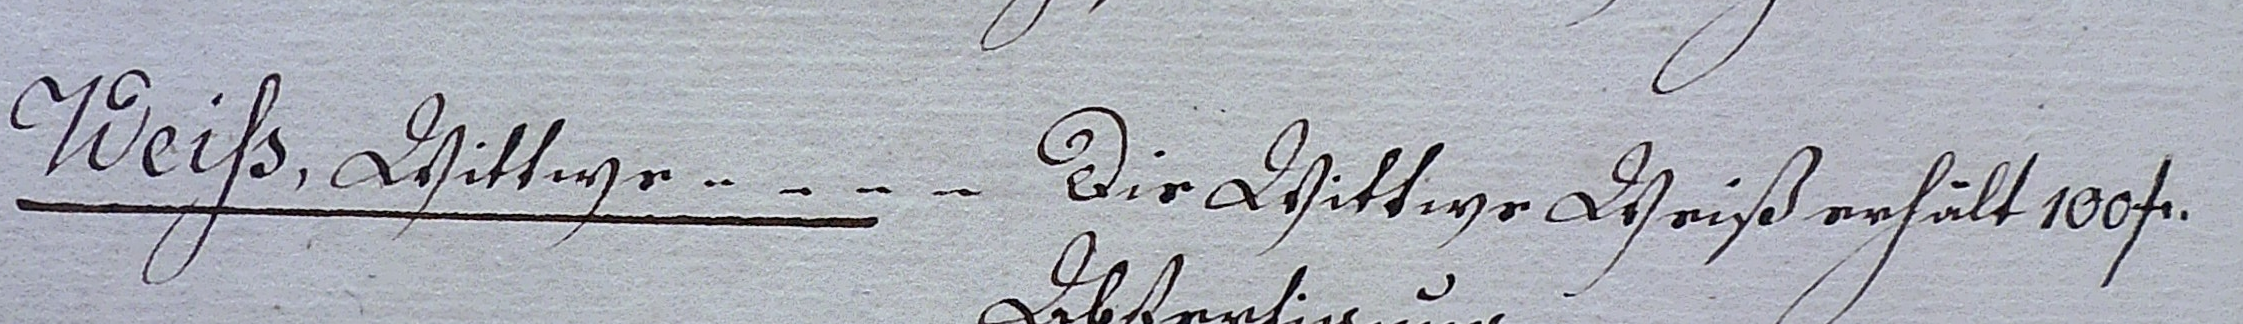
Weiss, Wittwe .. .. .. .. Die Wittwe Weiß erhält 100fr.
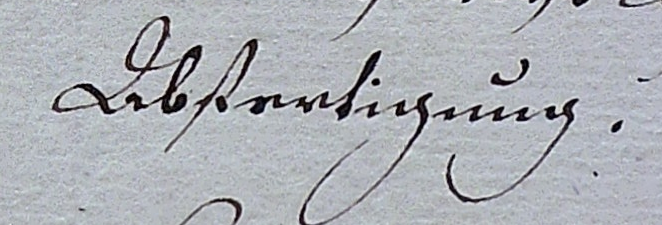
Abfertigung.
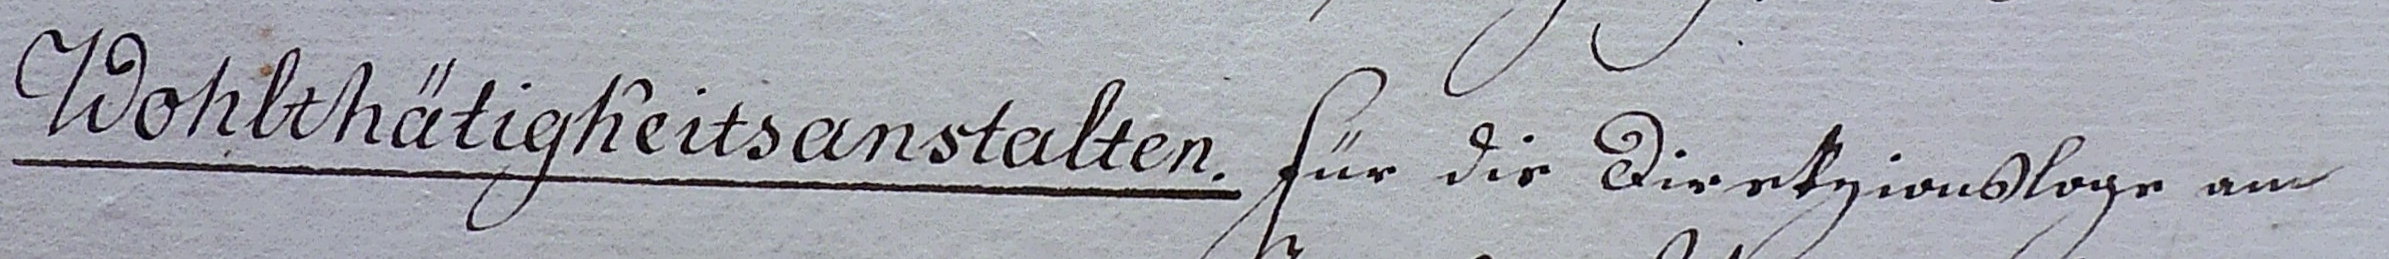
Wohlthätigkeitsanstalten. Für die Direkzionsloge am
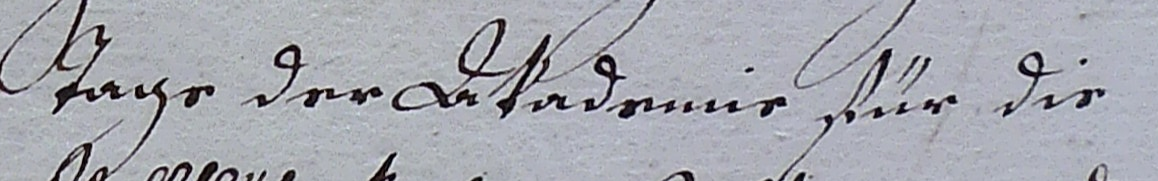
Tage der Akademie für die
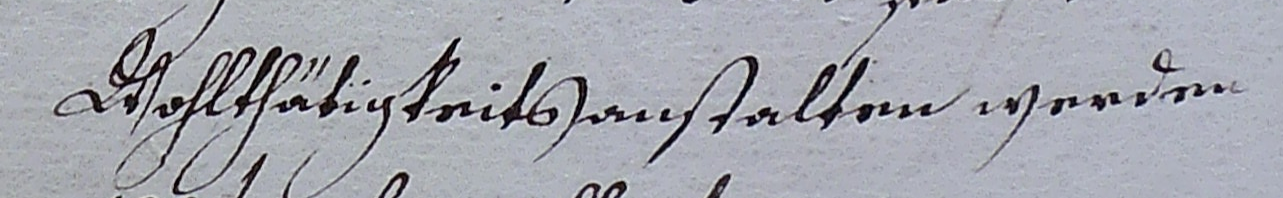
Wolthätigkeitsanstalten werden
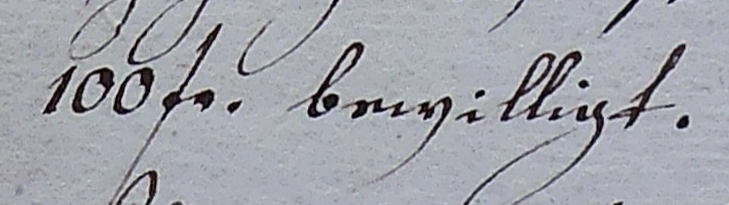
100fr. bewilligt.
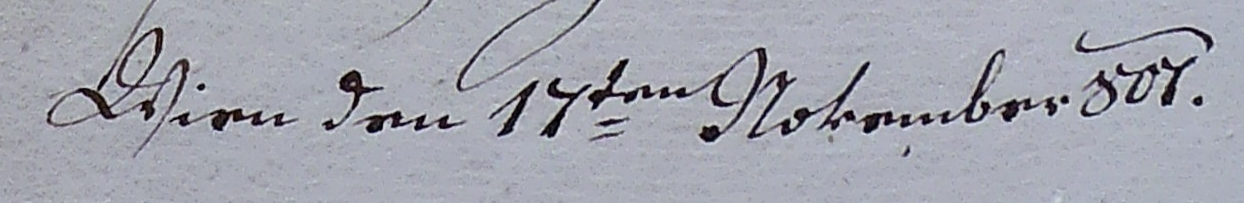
Wien den 17te͇n November 8͞0͞7.
